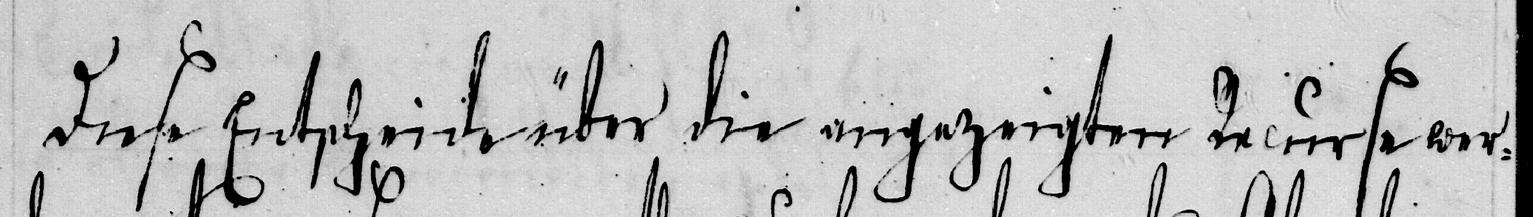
Diese Entscheide über die angezeigten Recurse wer¬
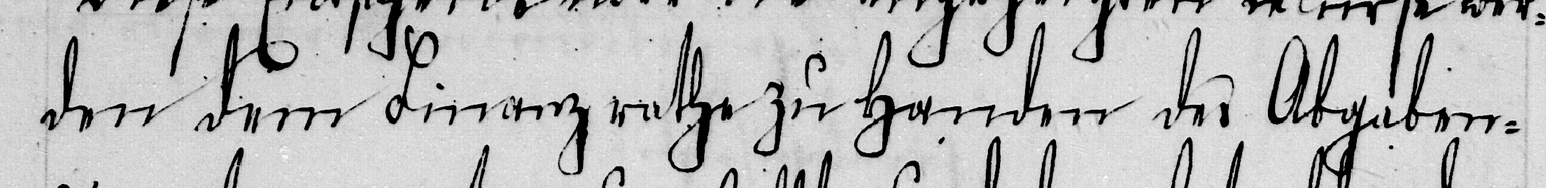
den dem Finanzrathe zu Handen des Abgabe¬
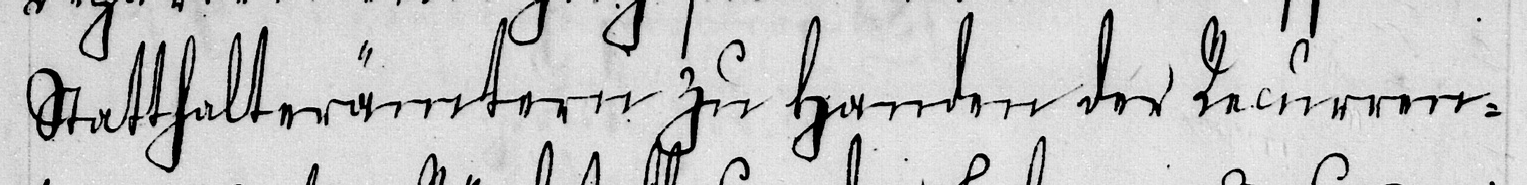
Statthalterämtern zu Handen der Recurren¬
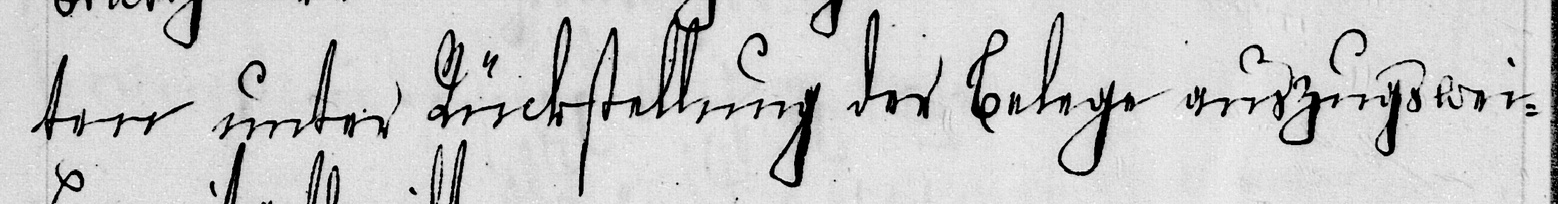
ten unter Rückstellung der Belege auszugswei¬
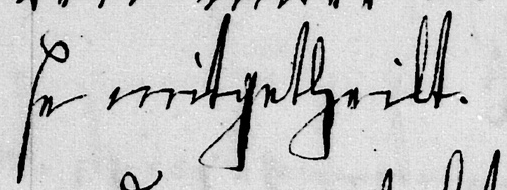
se mitgetheilt.
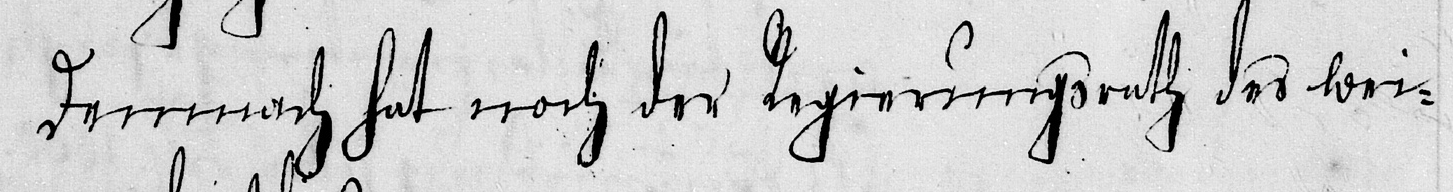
Demnach hat noch der Regierungsrath des wei¬
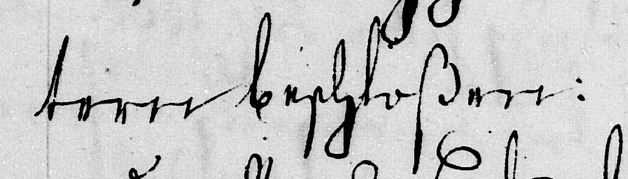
teren beschloßen:
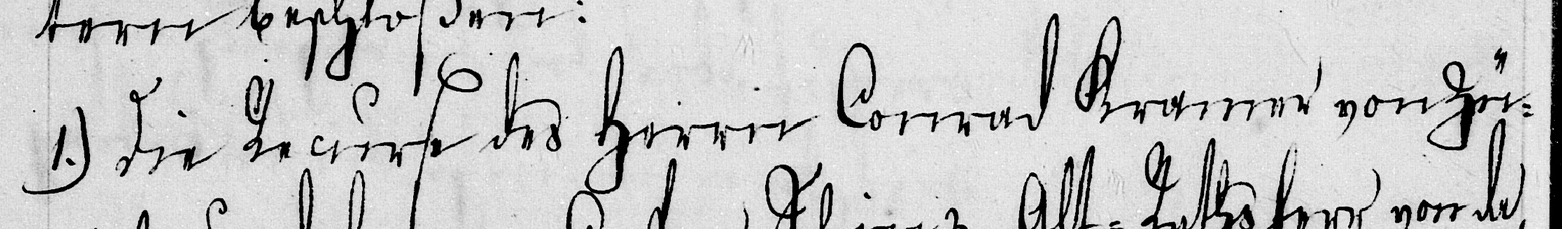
1.) Die Recurse des Herrn Conrad Kramer von Zü¬
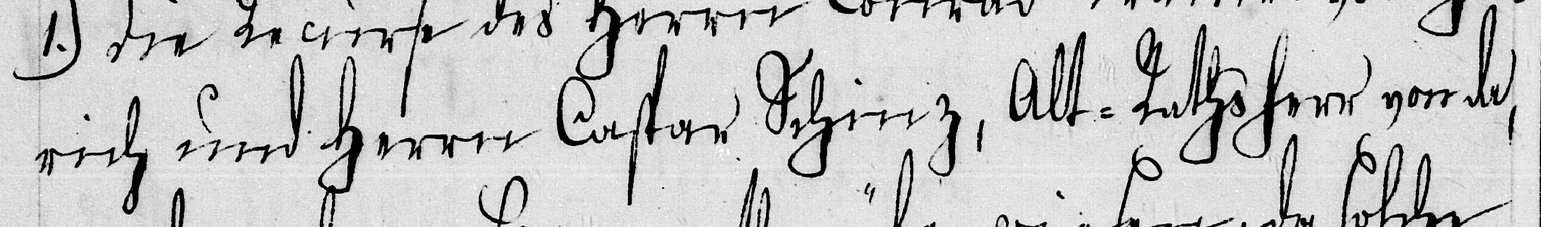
rich und Herrn Caspar Schinz, Alt-Rathsherr von
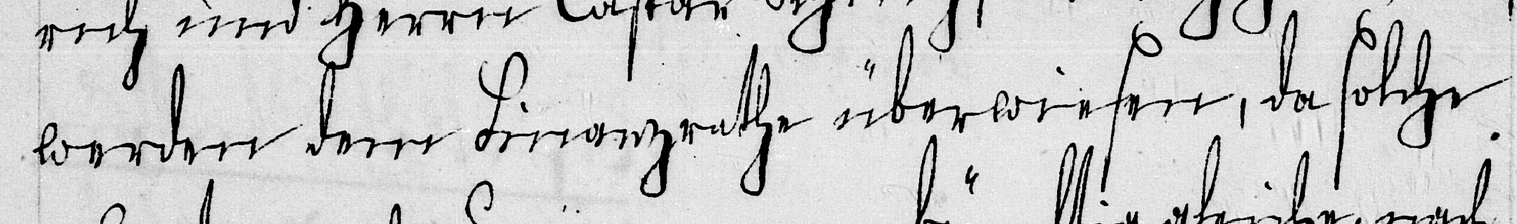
werden dem Finanzrathe überwiesen, da solche
